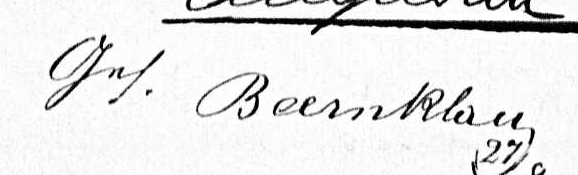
Ges. Baernklau
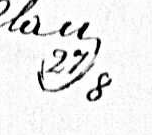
27/8
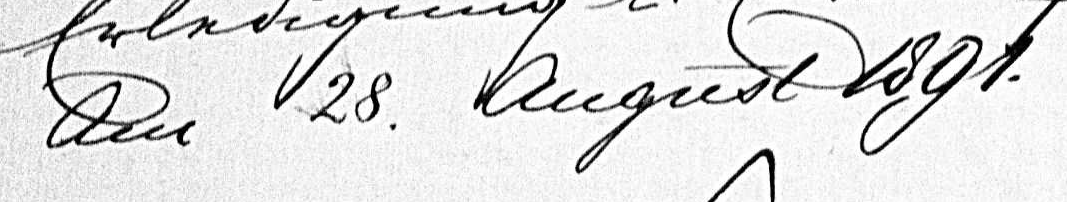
Am 28. August 1891
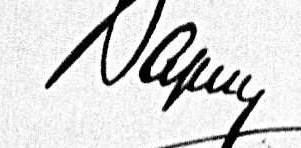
Papay
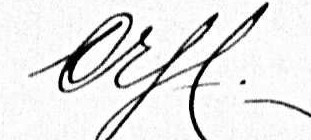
Ah. E.
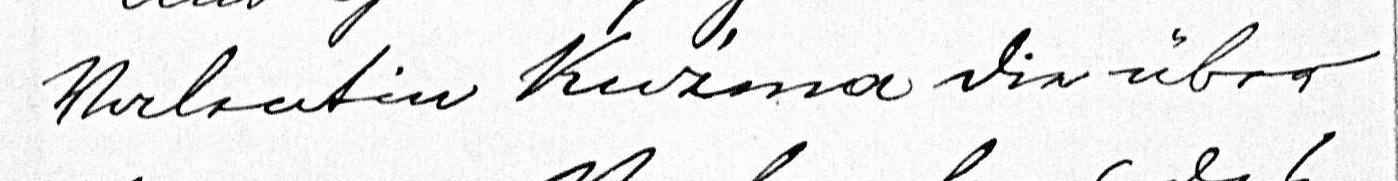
Valentin Kuźma die über
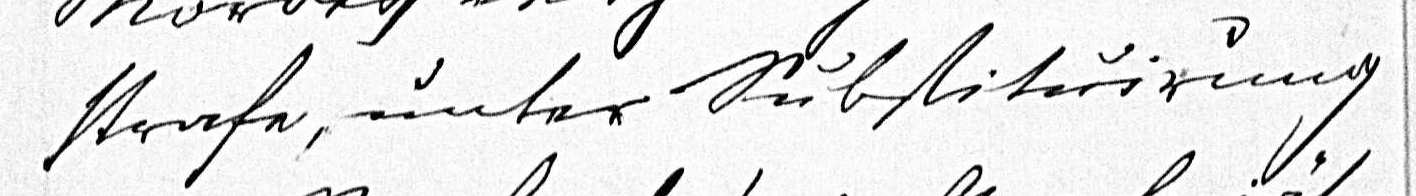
strafe unter Substituirung
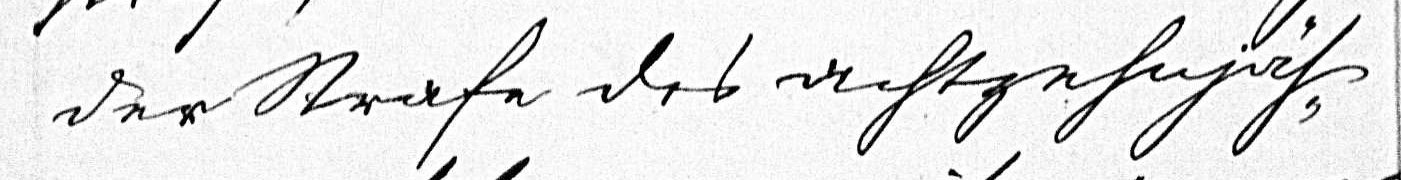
der Strafe des achtzehnjäh¬
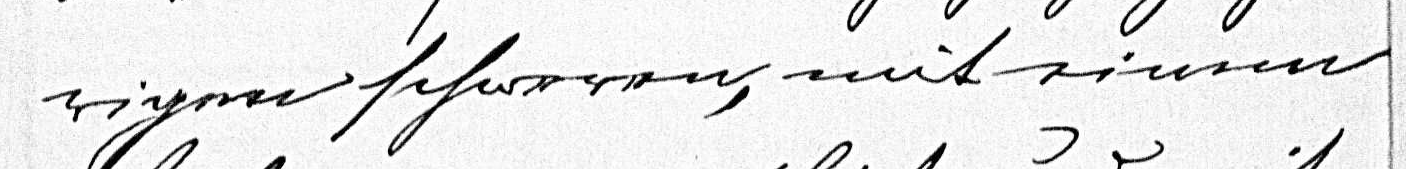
rigen schweren, mit einem
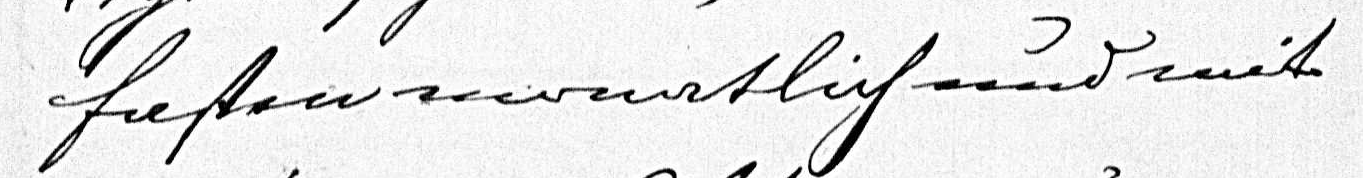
Fasten monatlich und mit
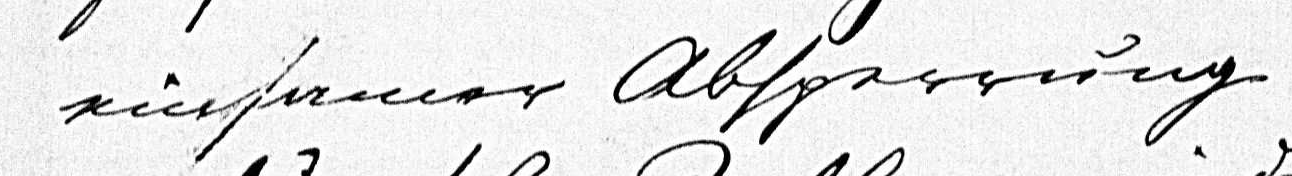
einsamer Absperrung
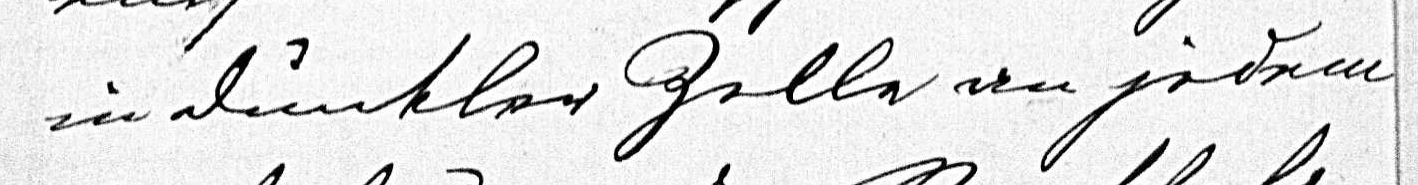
in dunkler Zelle an jedem
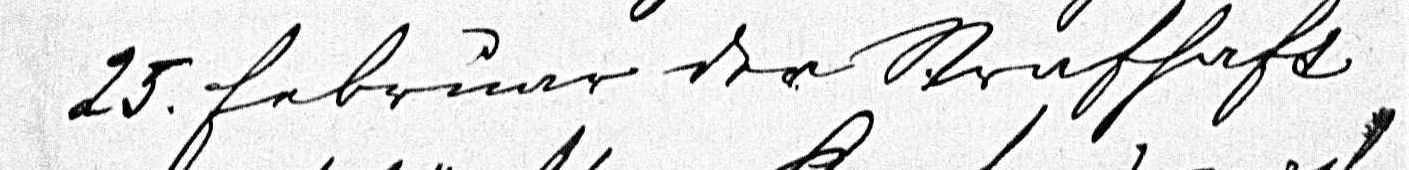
25. Februar der Straffakt
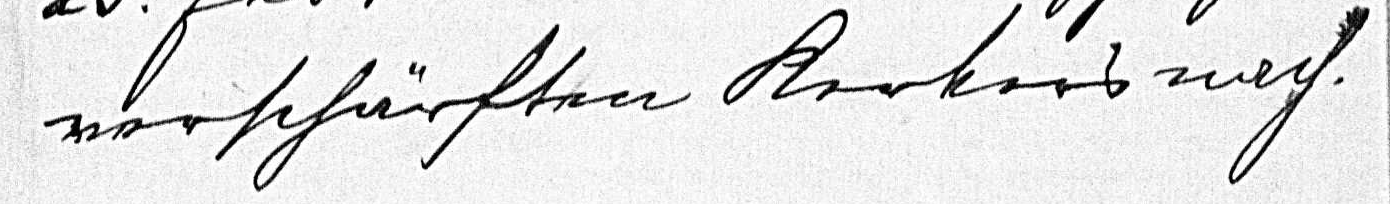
verschärften Kerkers nach.
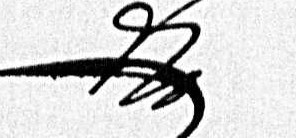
FJ
